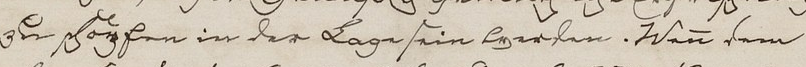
zu schöpfen in der Lage sein werden. Wenn dem
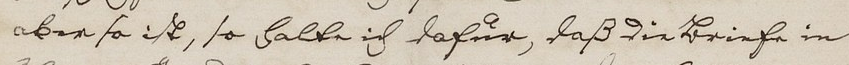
aber so ist, so halte ich dafür, daß die Briefe in
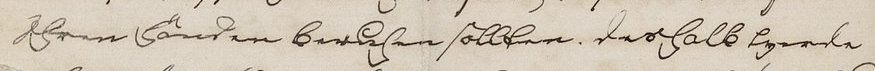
Ihren Händen beruhen sollten. Deshalb werde
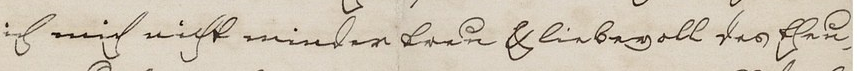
ich mich nicht minder treu & liebevoll des theu-
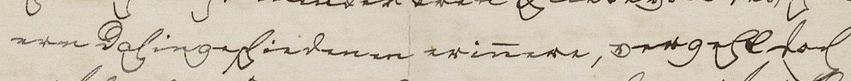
ern Dahingeschiedenen erinnern, vergeht doch
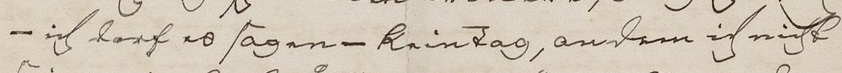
– ich darf es sagen – kein Tag, an dem ich nicht
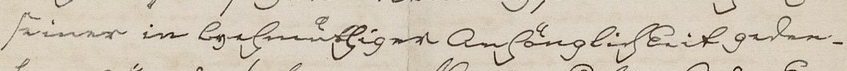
seiner in wehmüthiger Anhänglichkeit geden-
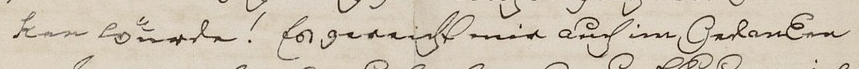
ken würde! Es gereicht mir auch im Gedanken
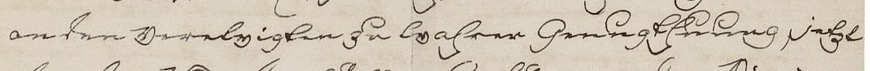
an den Verewigten zu wahrer Genugthuung, jetzt
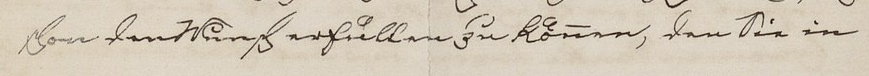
schon den Wunsch erfüllen zu können, den Sie in
